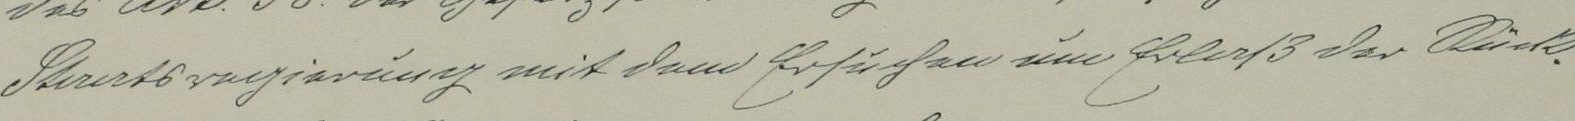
Staatsregierung mit dem Ersuchen um Erlaß der Rück-
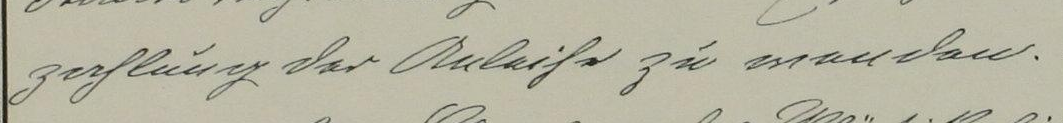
zahlung der Anleihe zu wenden.
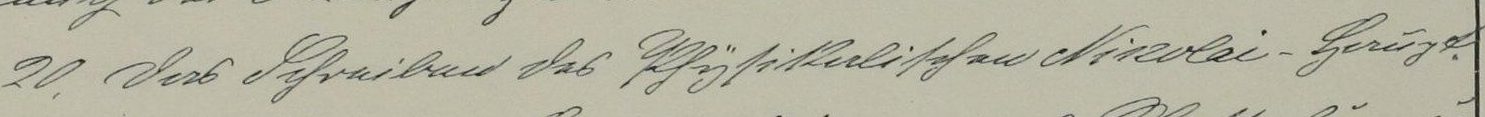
20. Das Schreiben des Physikalischen Nikolai-Haupt-
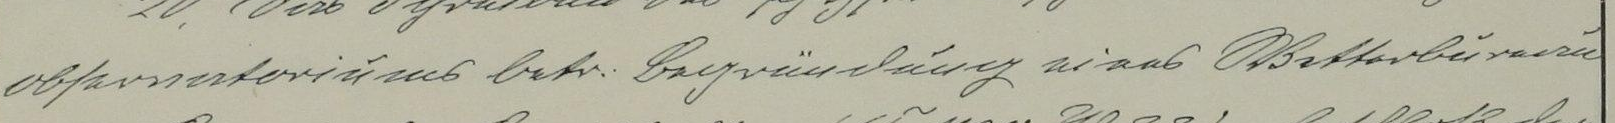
observatoriums betr. Begründung eines Wetterbureau
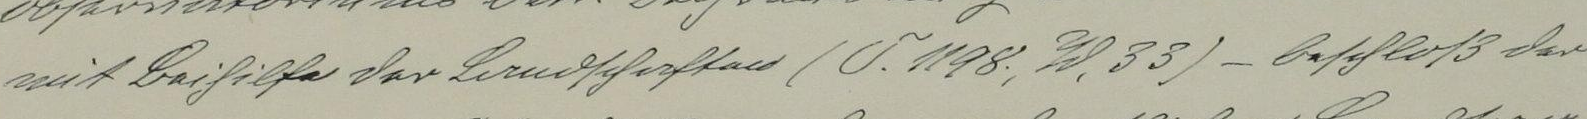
mit Beihilfe der Landschaften (T.1198; W.33) - beschloß der
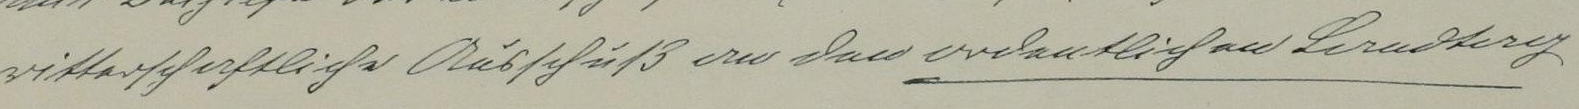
ritterschaftliche Ausschuß an den ordentlichen Landtag
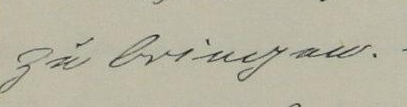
zu bringen.
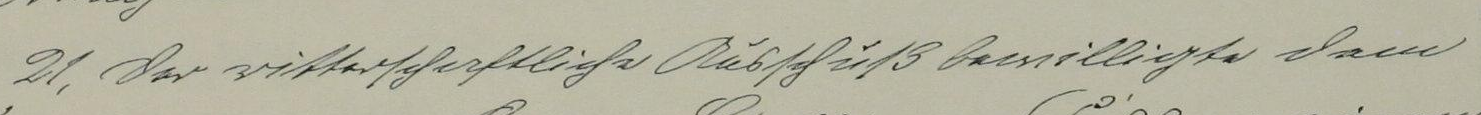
21. Der ritterschaftliche Ausschuß bewilligte dem
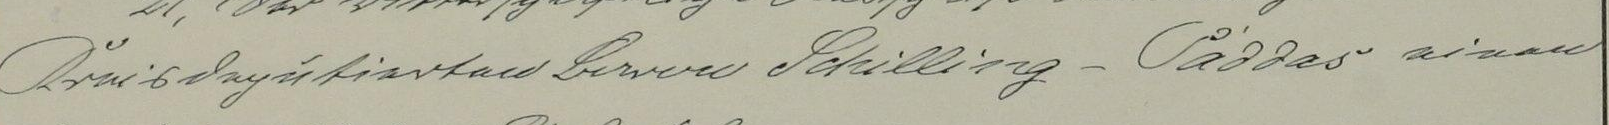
Kreisdeputierten Baron Schilling-Paddas einen
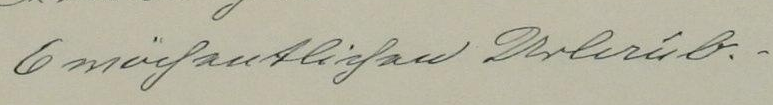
6wöchentlichen Urlaub.
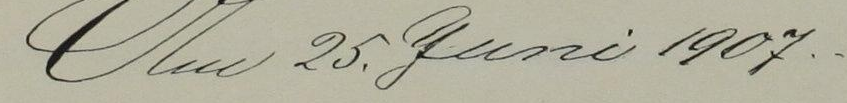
Am 25. Juni 1907.
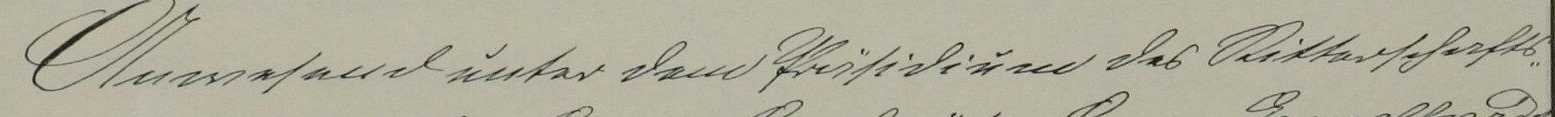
Anwesend unter dem Präsidium des Ritterschafts-
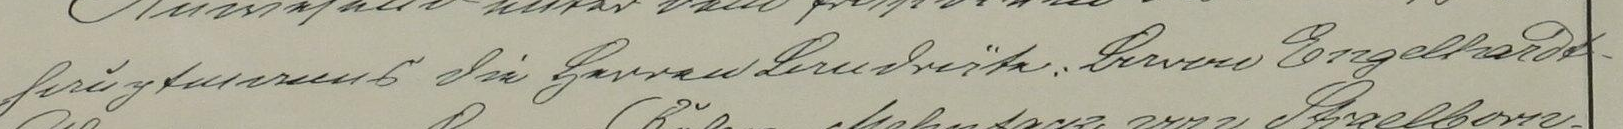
hauptmanns die Herren Landräte: Baron Engelhardt-
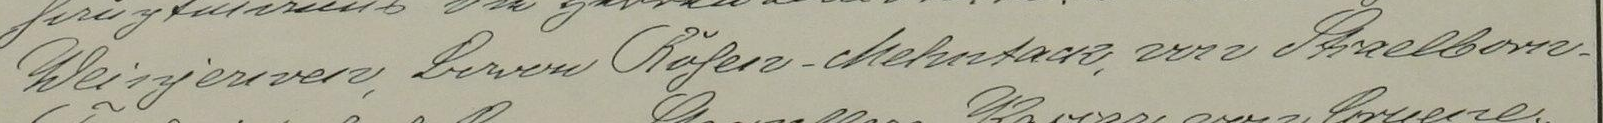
Weinjerwen, Baron Rosen-Mehntack, von Straelborn-
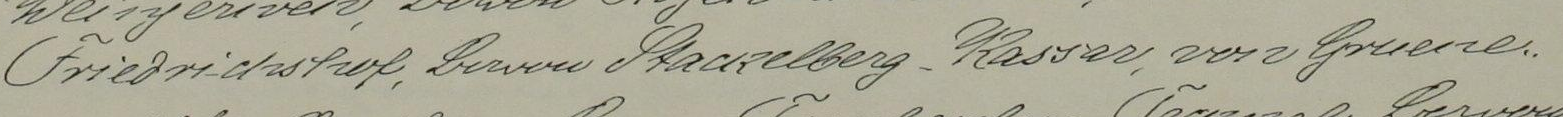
Friedrichshof, Baron Stackelberg-Kassar, von Gruene-
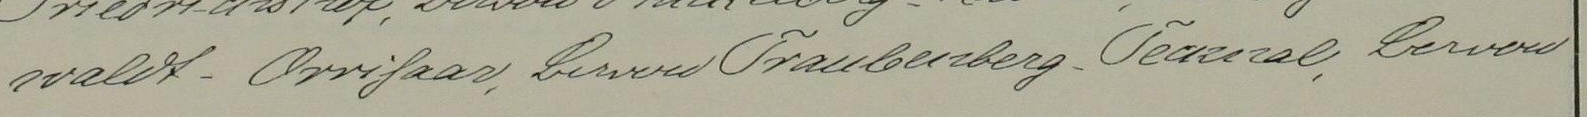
waldt-Orrisaar, Baron Traubenberg-Tecknal, Baron
